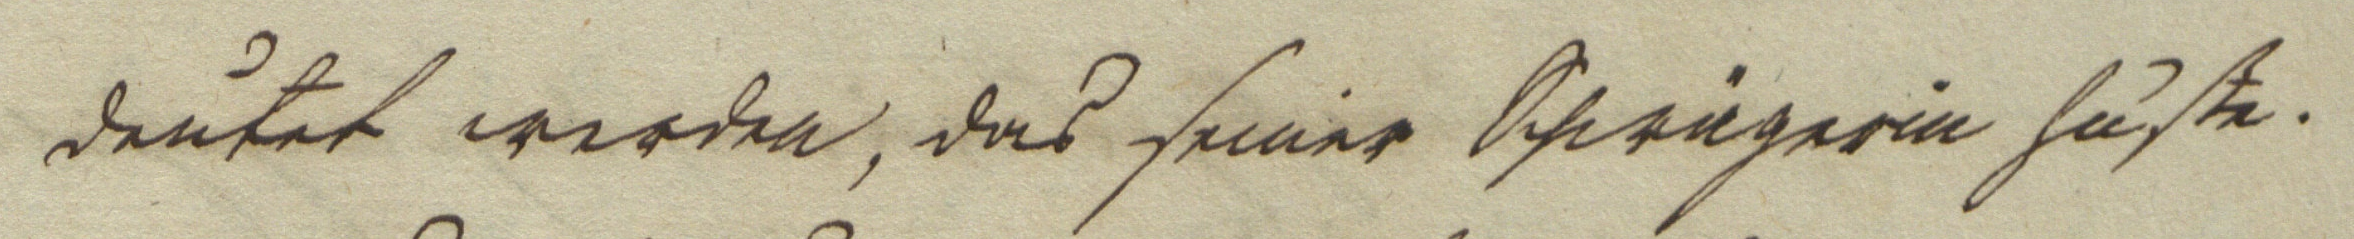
deutet werden, das seiner Schwägerin zuste¬
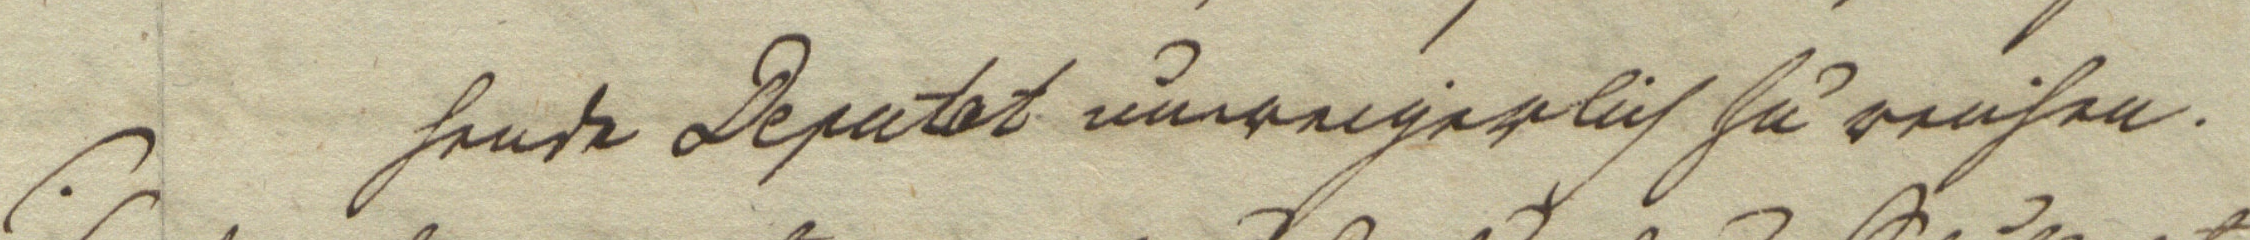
hende Deputat unweigerlich zu reichen.
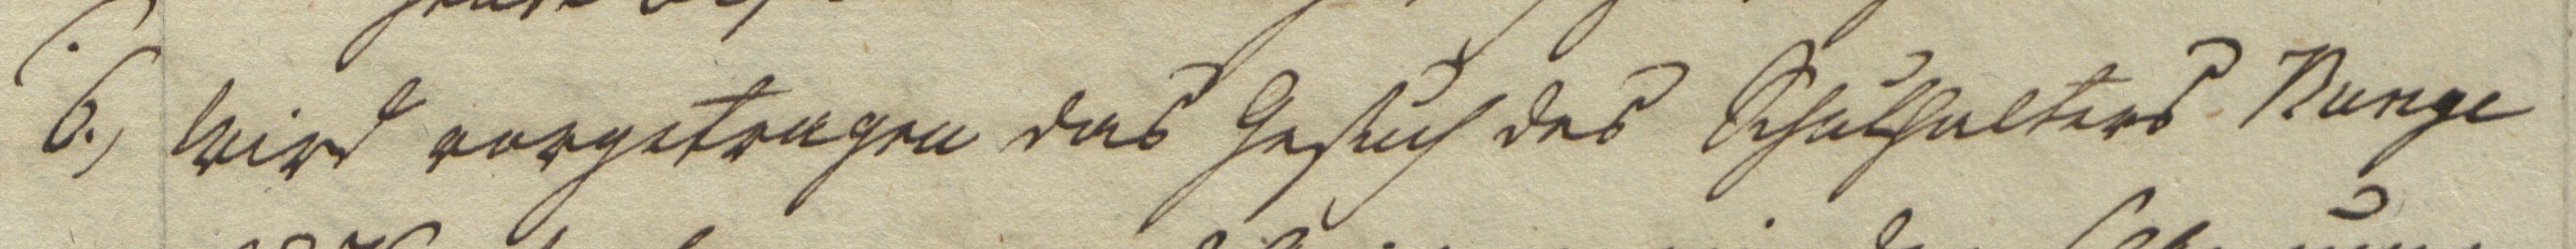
6., Wird vorgetragen das Gesuch des Schulhalters Bunge
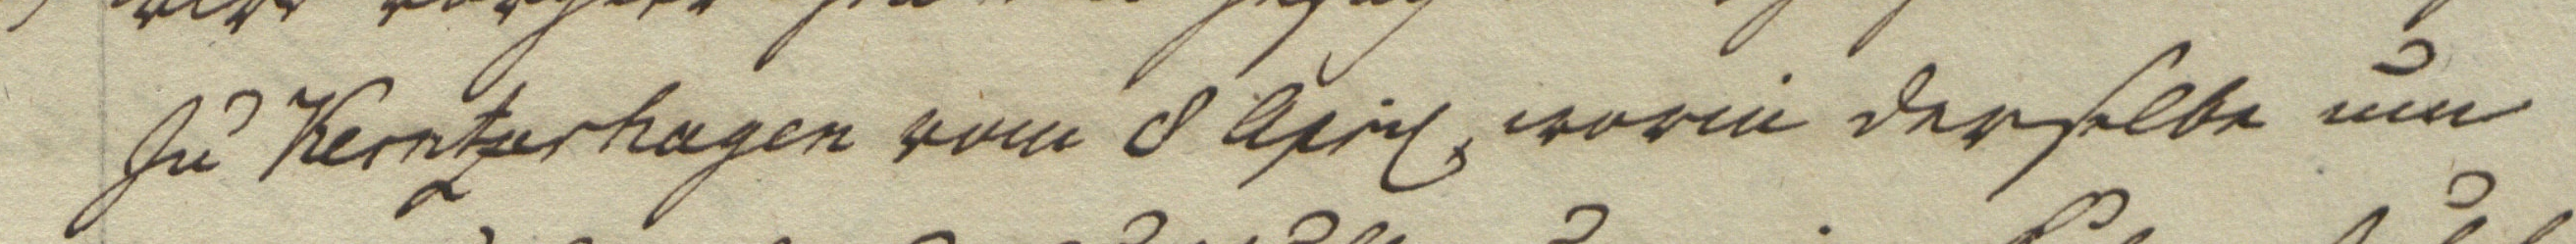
zu Kemtzerhagen vom 8 April. worin derselbe um
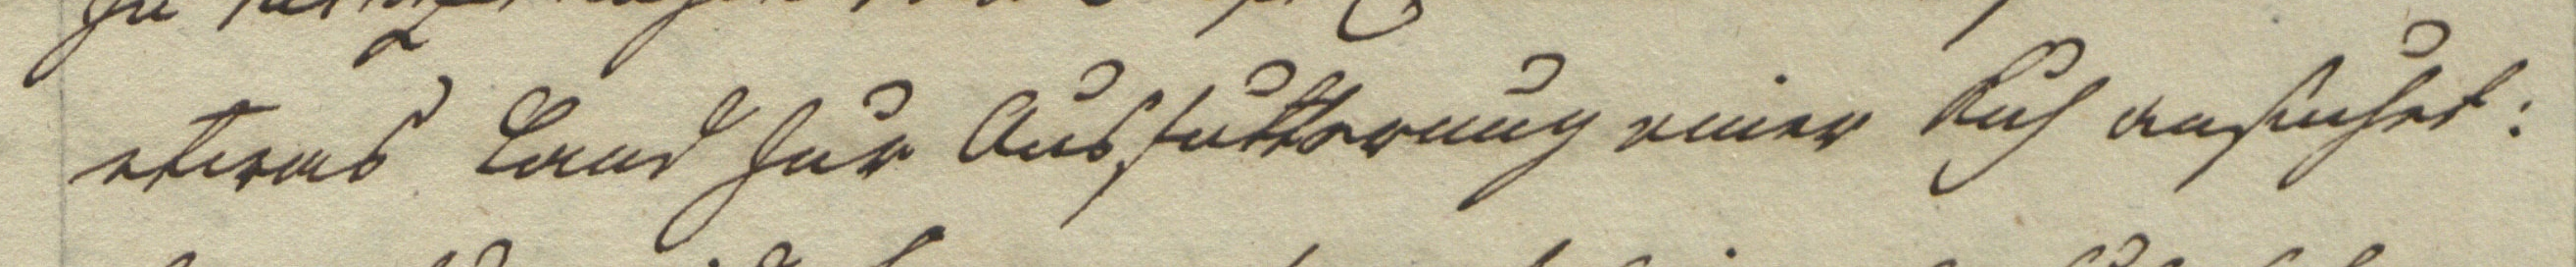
etwas Land zur Ausfutterung einer Kuh ansuchet:
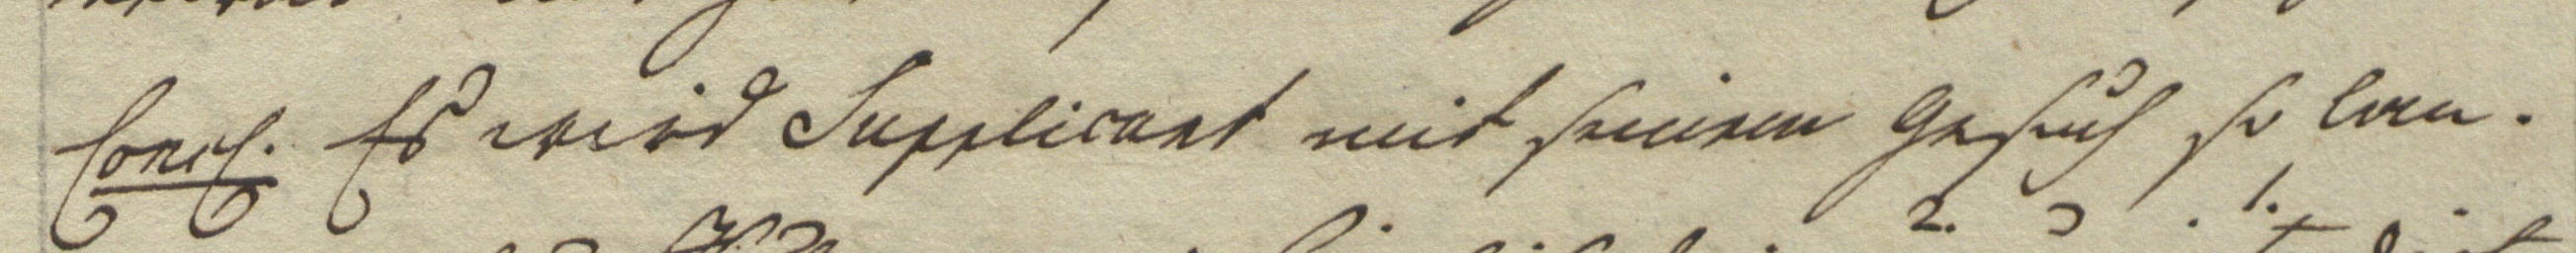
Concl. Es wird Supplicant mit seinem Gesuch so lan¬
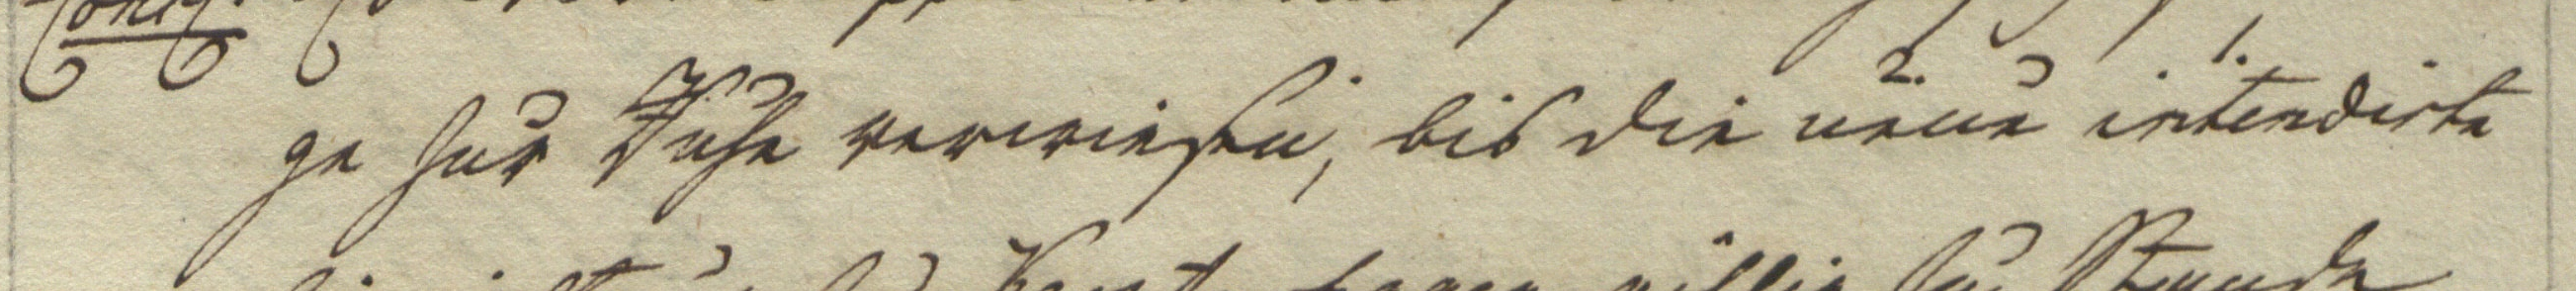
ge zur Ruhe verwiesen, bis die neue intendirte
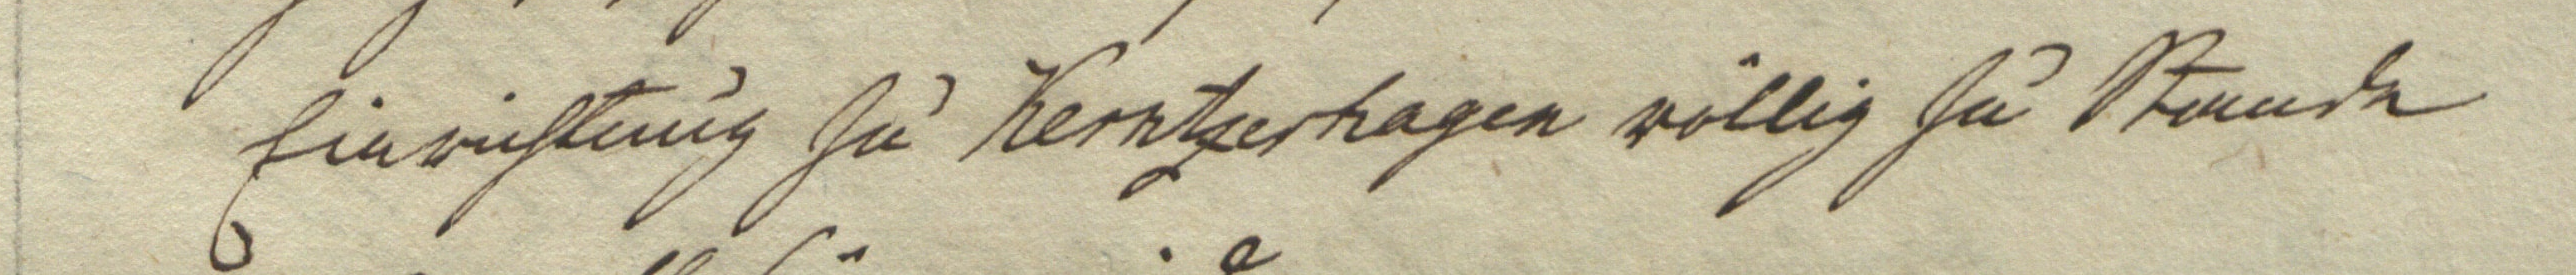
Einrichtung zu Kemtzerhaben völlig zu Stande
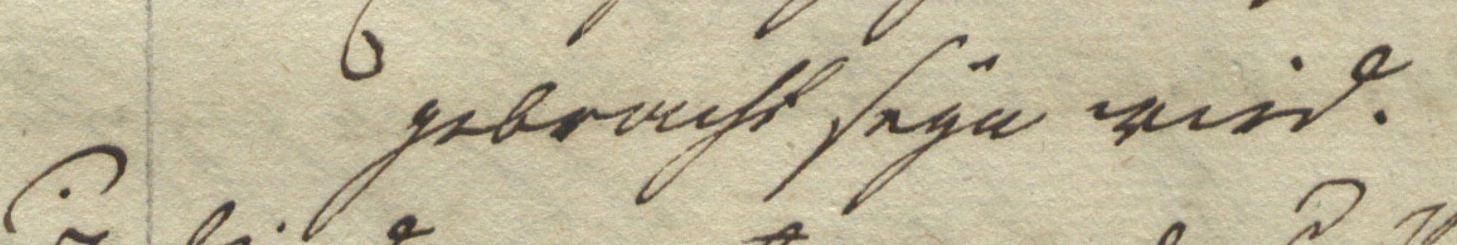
gebracht seyn wird.
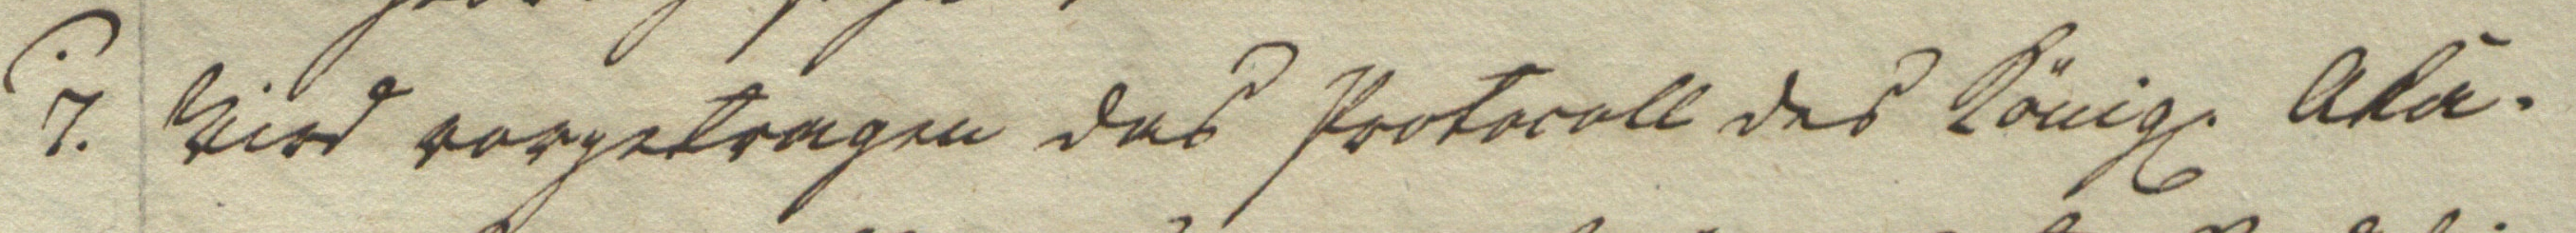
7. Wird vorgetragen das Protocoll des Königl. Aka¬
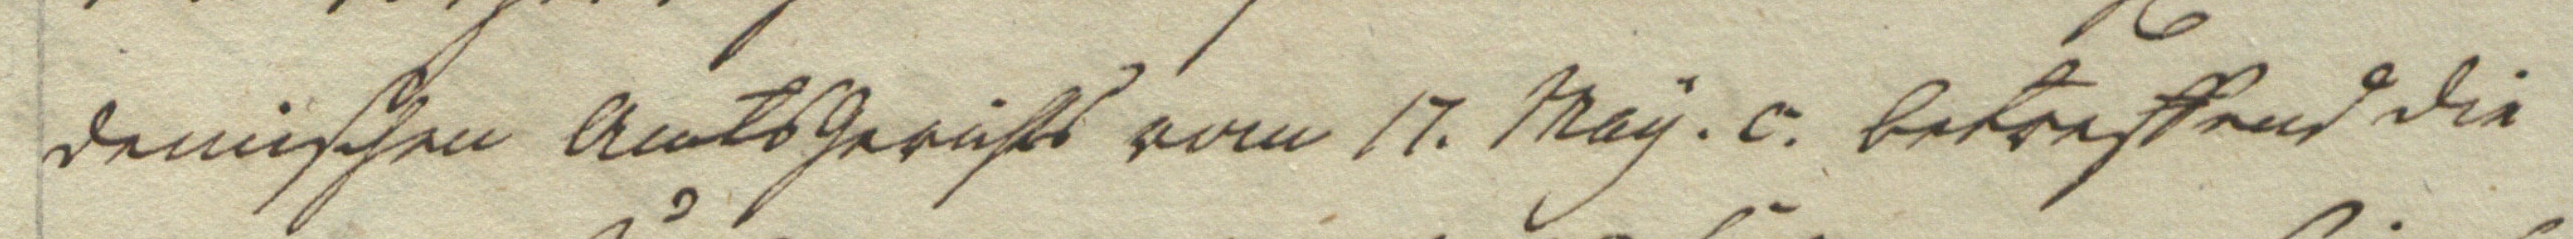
demischen Amts Gerichts vom 17. May. c. betreffend die
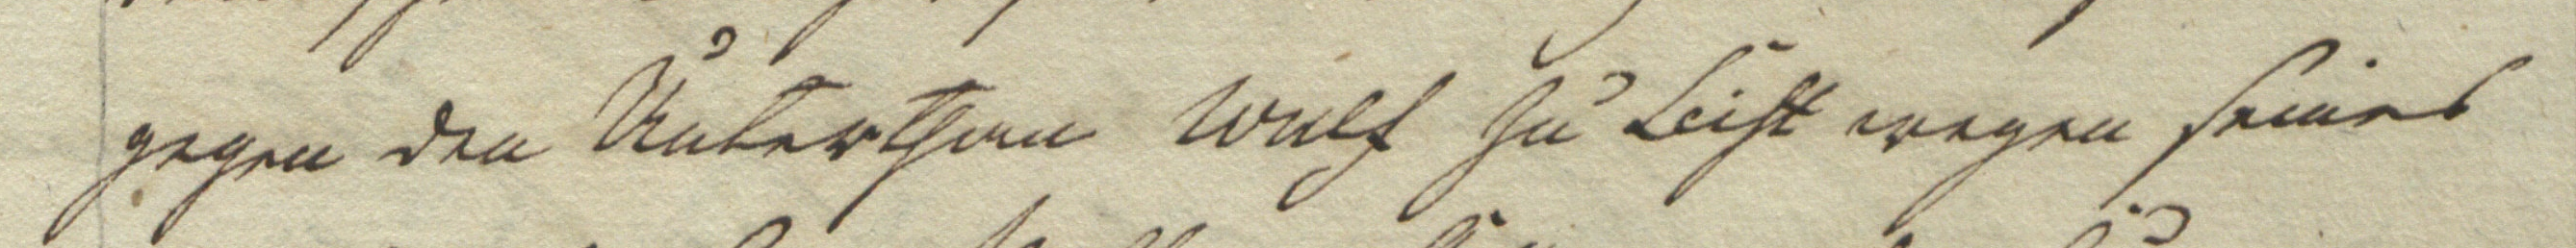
gegen den Unterhan Wulf zu Leist wegen seines
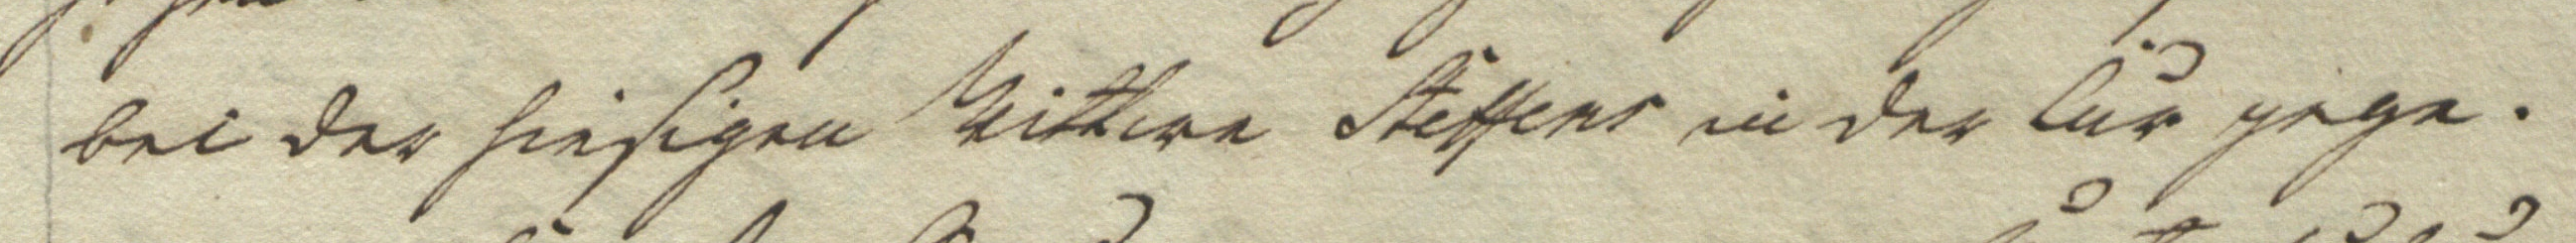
bei der hiesigen Wittwe Steffens in der Cur gege¬
